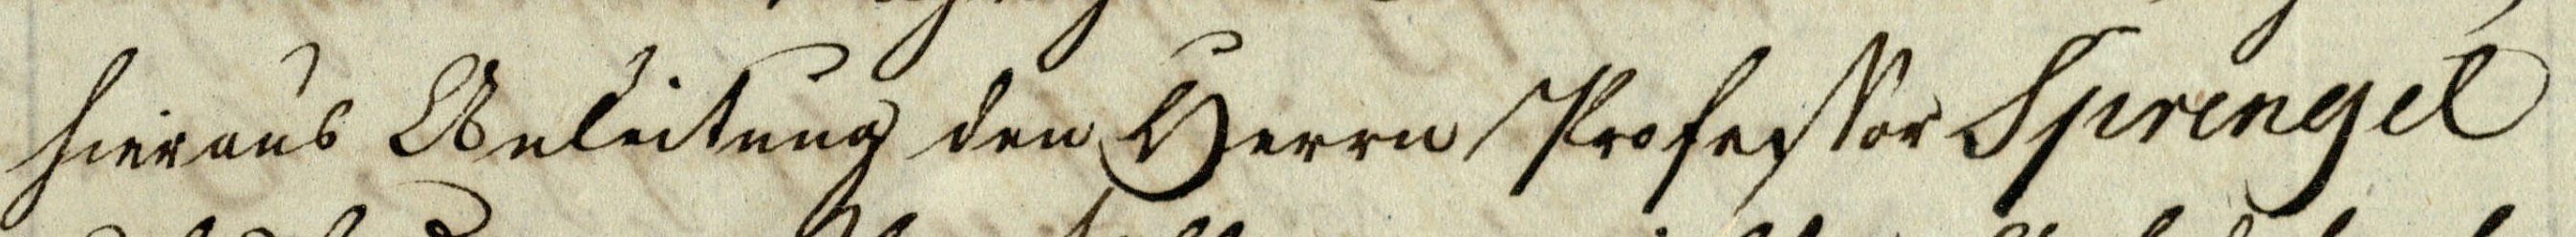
hieraus Anleitung den Herrn Professor Sprengel
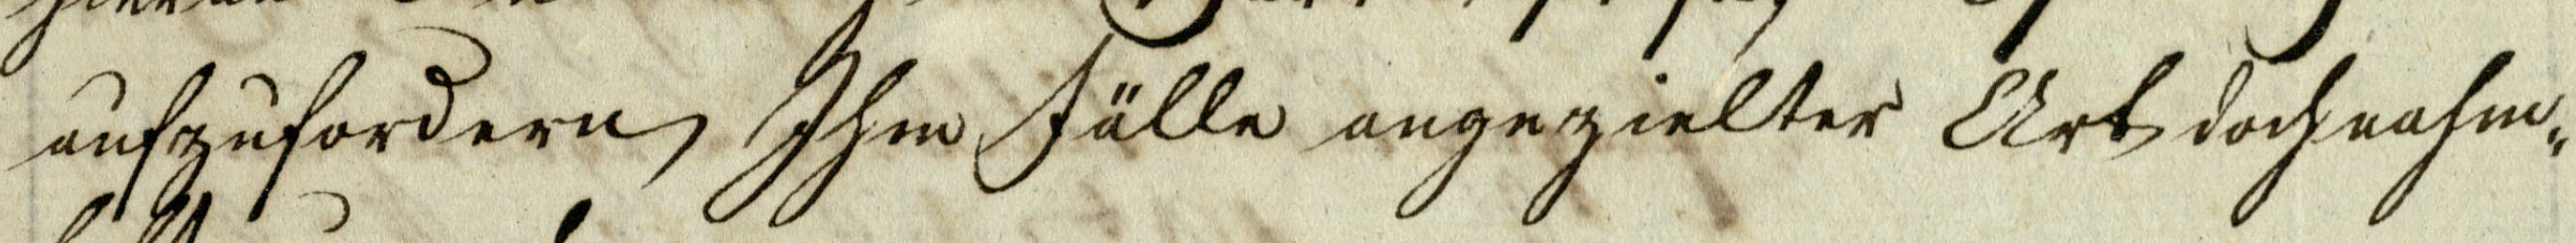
aufzufordern Ihm Fälle angezielter Art doch nahm¬
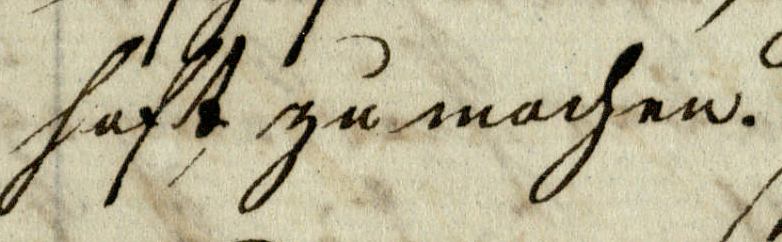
haft zu machen.
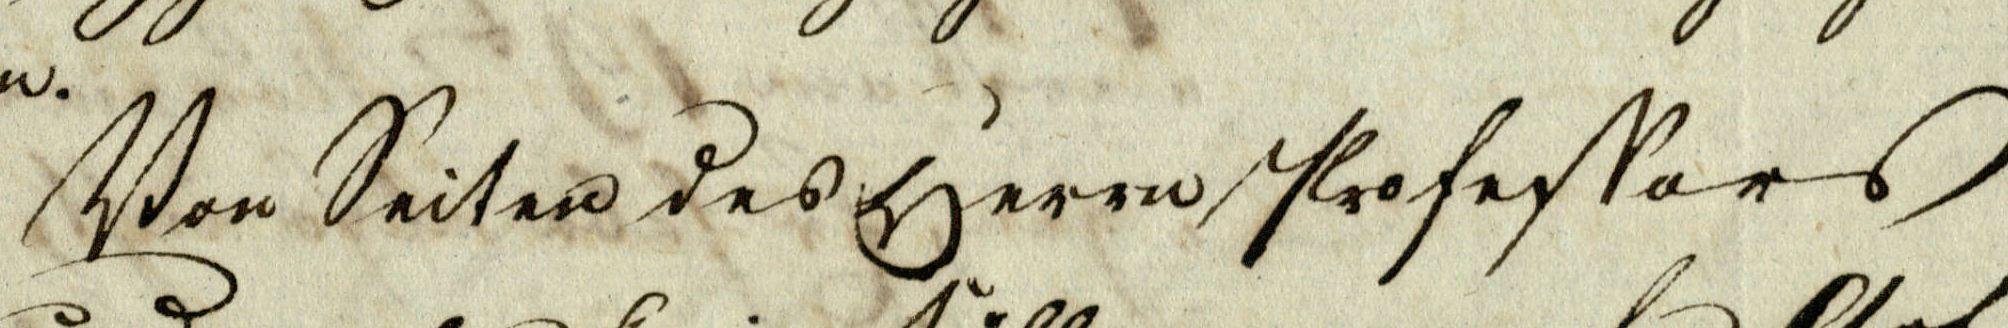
Von Seiten des Herrn Professors
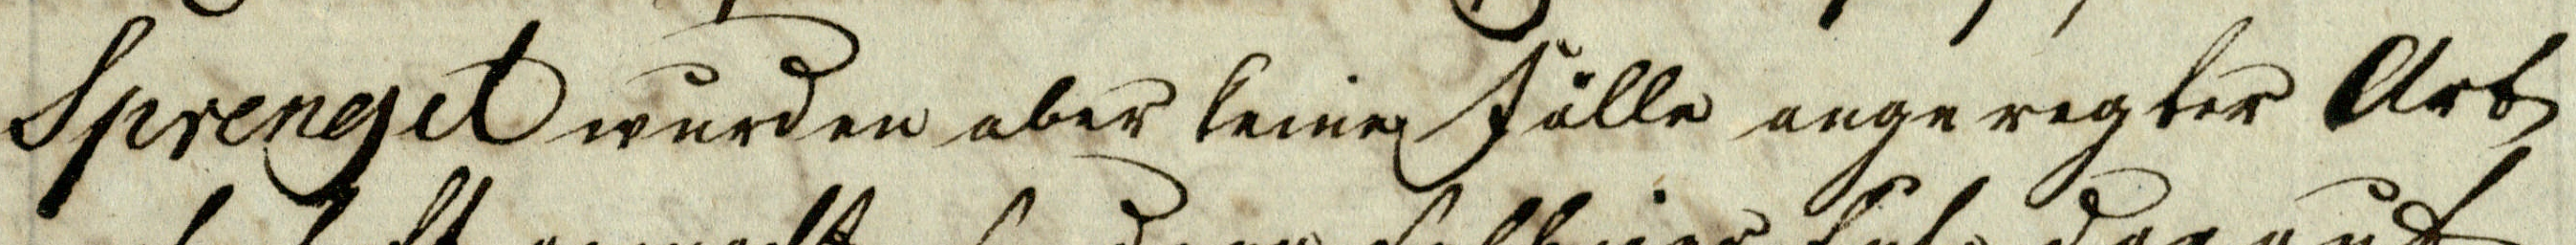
Sprengel wurden aber keine Fälle angeregter Art
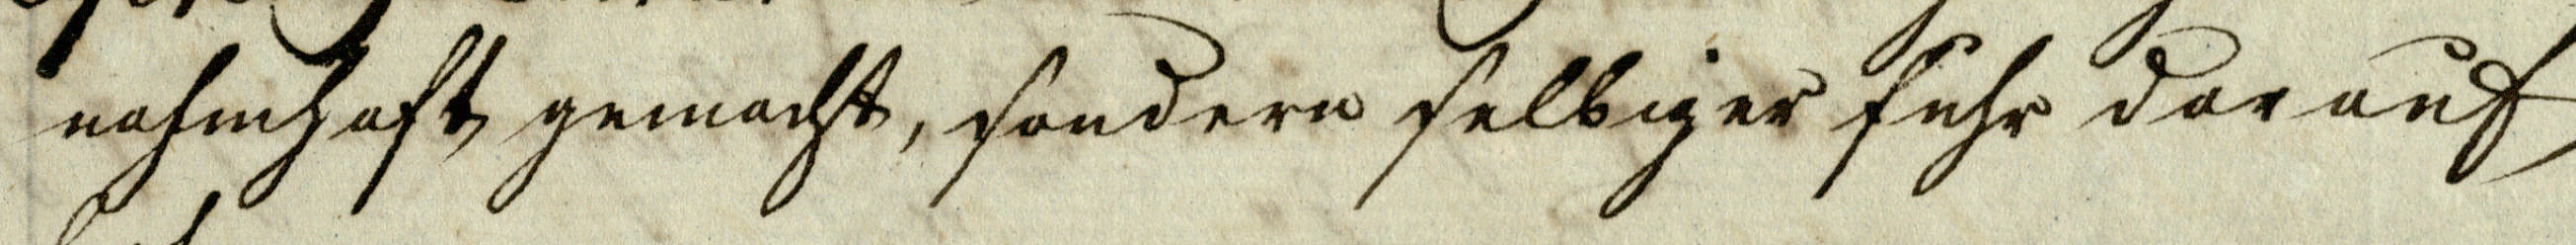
nahmhaft gemacht, sondern selbiger fuhr darauf
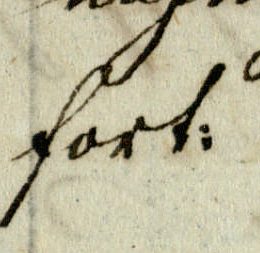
fort:
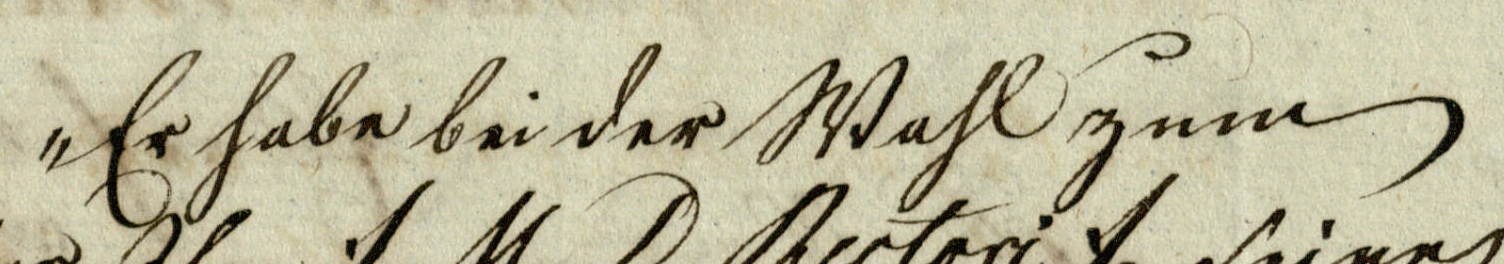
"Er habe bei der Wahl zum
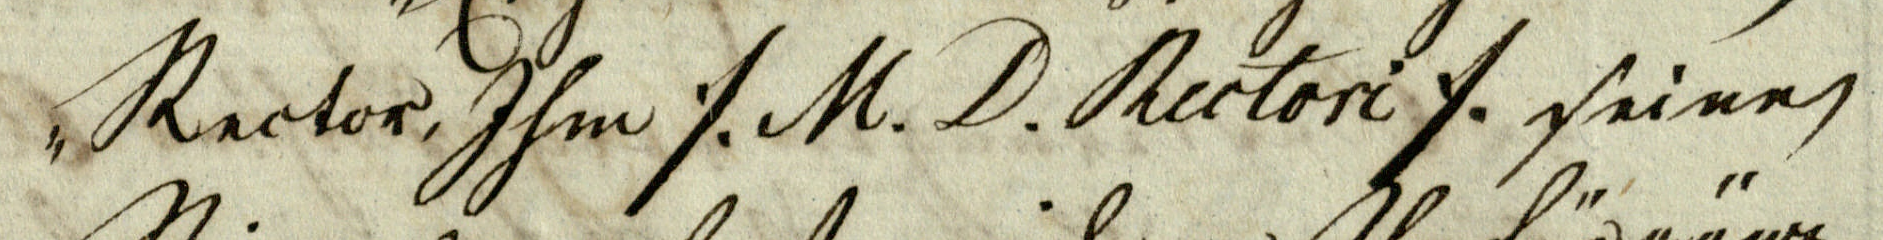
"Rector, Ihm /. M. D. Rector /. seine
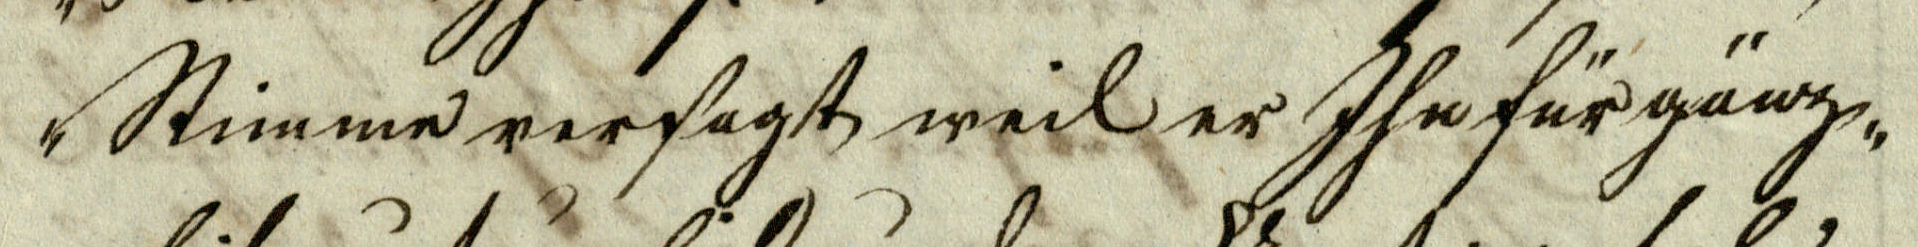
"Stimme versagt, weil er Ihn für gänz¬
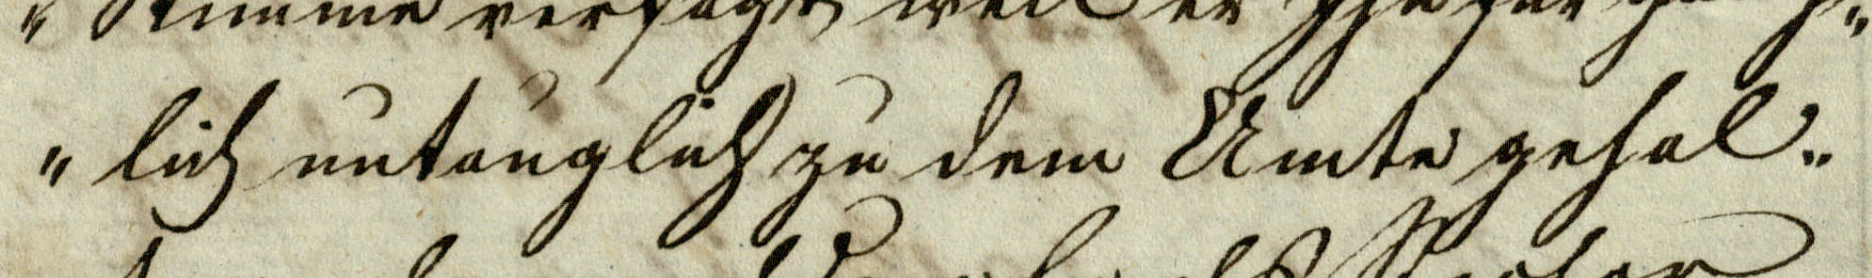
"lich untauglich zu dem Amte gehal¬
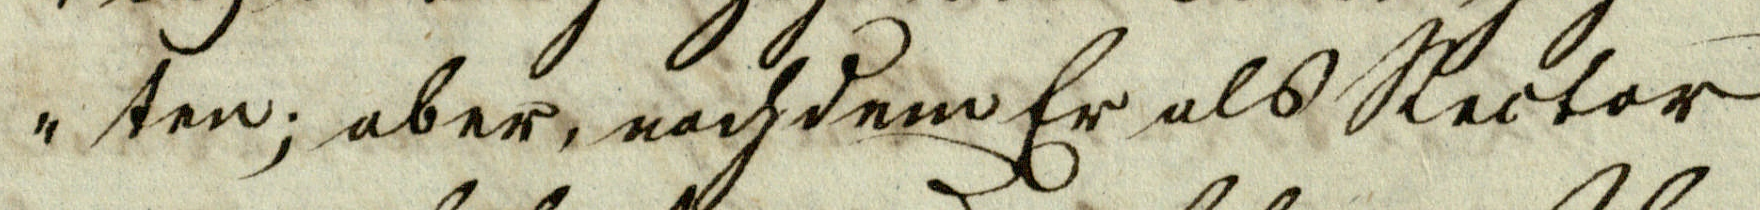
"ten; aber, nachdem Er als Rector
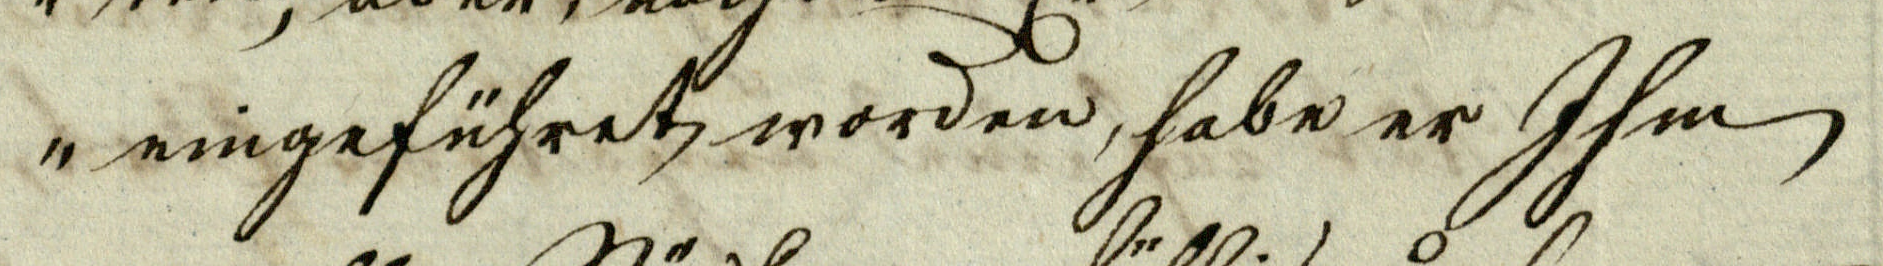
"eingeführet worden, habe er Ihm
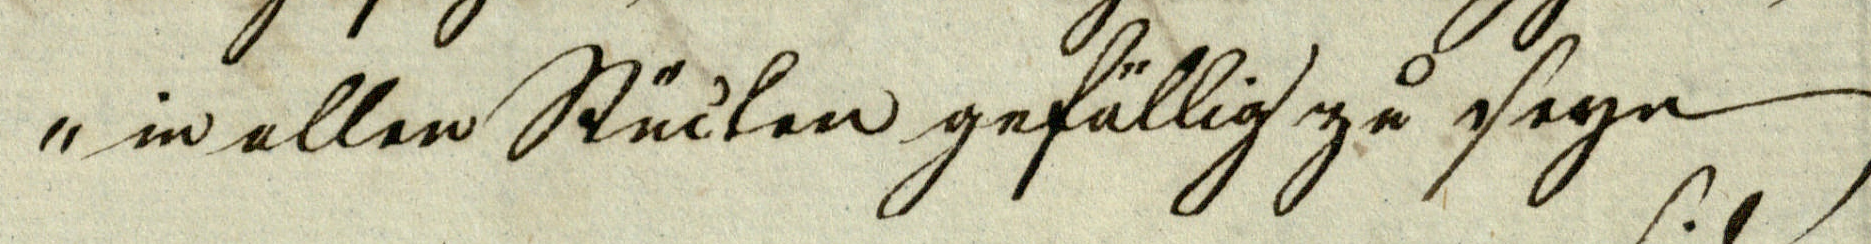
"in allen Stücken gefällig zu seyn
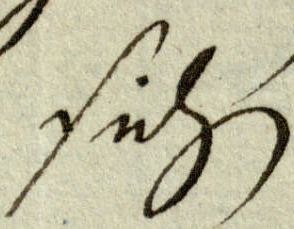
sich
